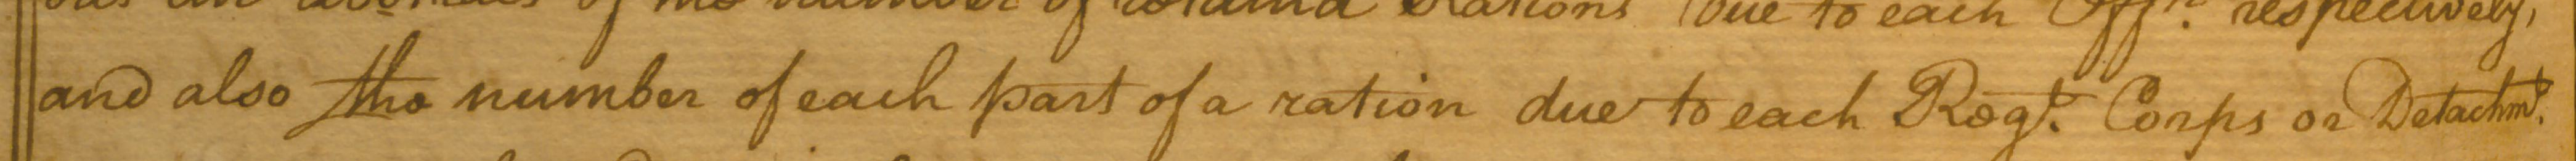and also the number of each part of a ration due to each Reg^t. Corps or Detachm^t.
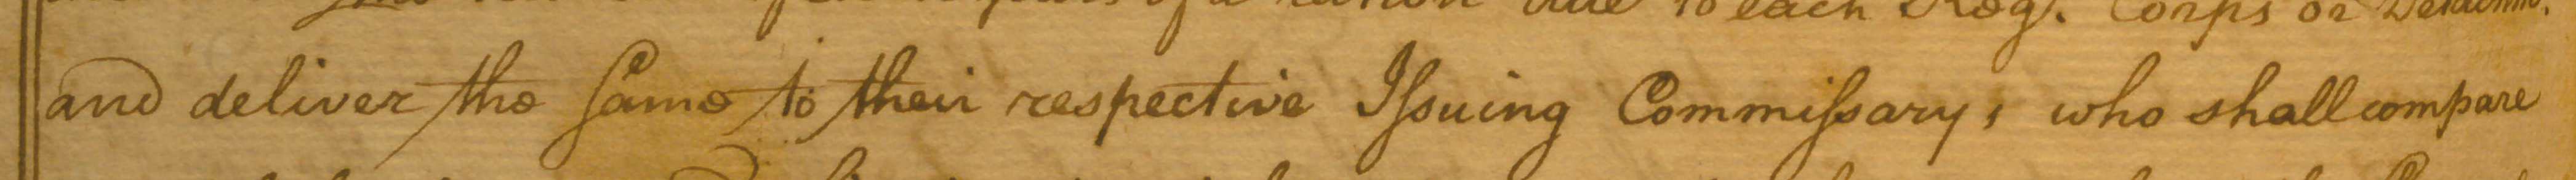and deliver the same to their respective Issuing Commissary, who shall compare
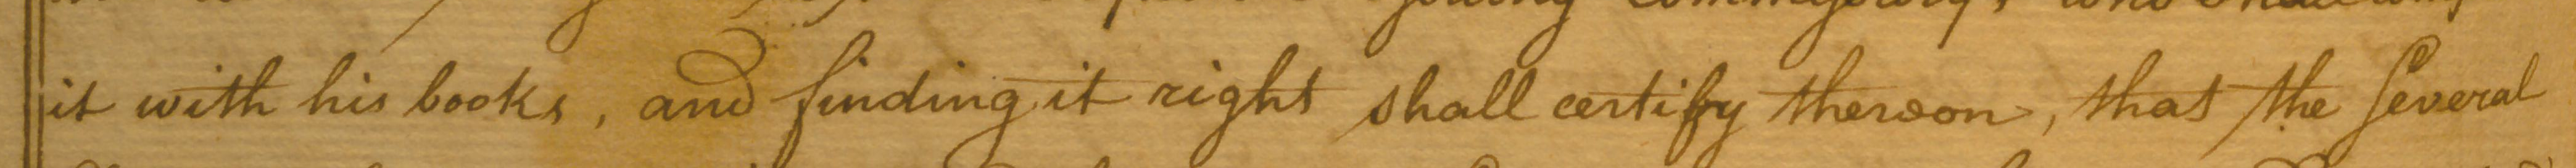it with his books, and finding it right shall certify thereon, that the several
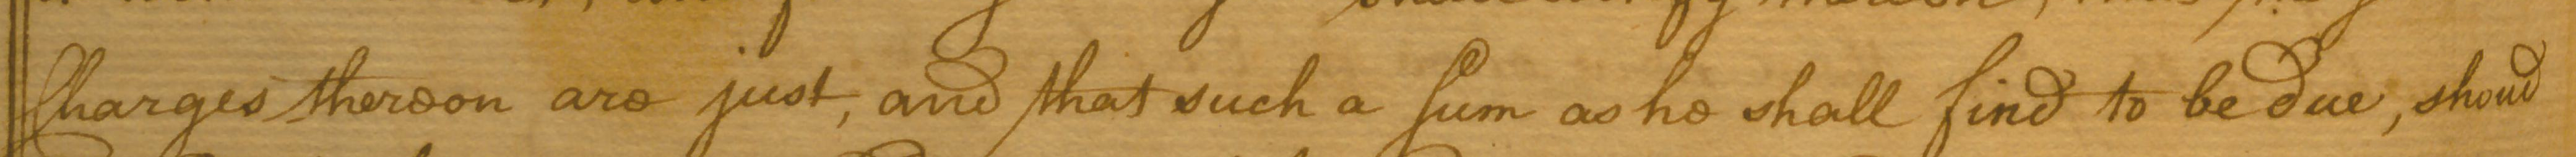Charges thereon are just, and such a sum as he shall find to be due, shoud
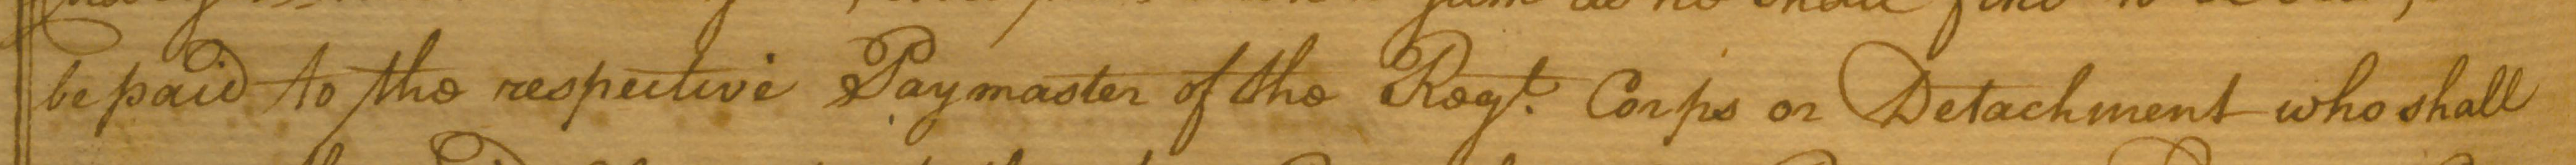be paid to the respective Paymaster of the Reg^t. Corps or Detachment who shall
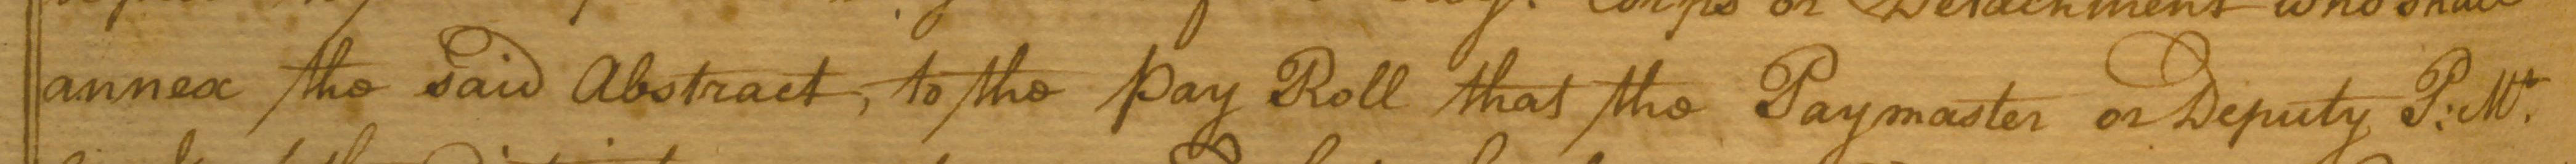annex the said Abstract, to the Pay Roll that the Paymaster or Deputy P: M^s.
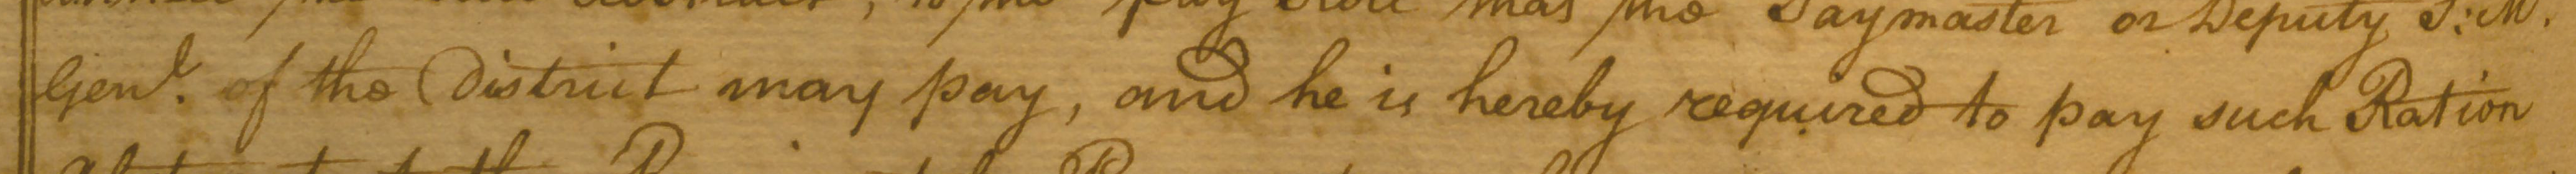Gen^l. of the district may pay, and he is hereby required to pay such Ration
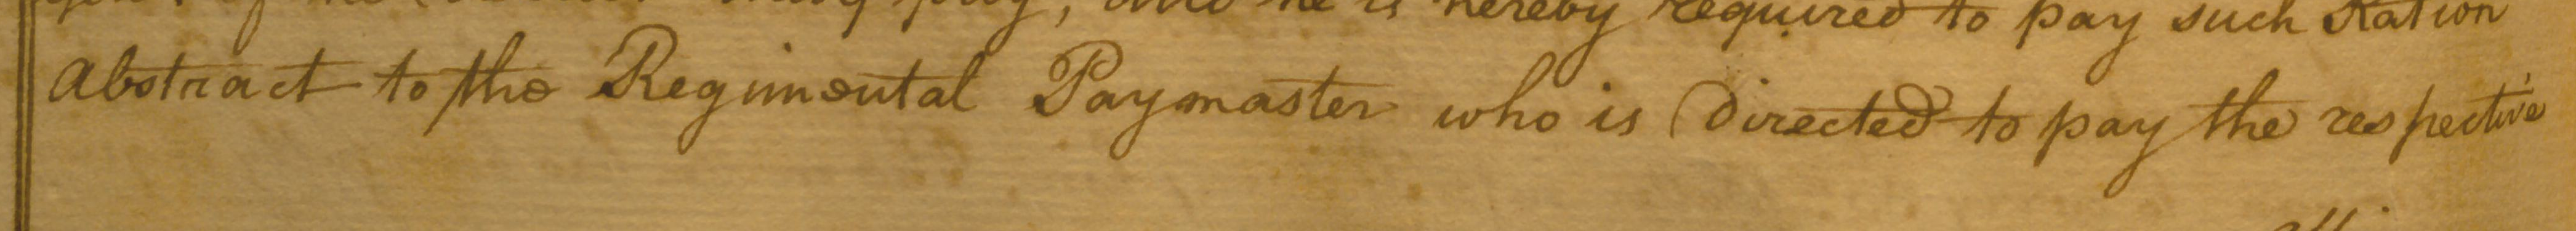abstract to the Regimental Paymaster who is directed to pay the respective
